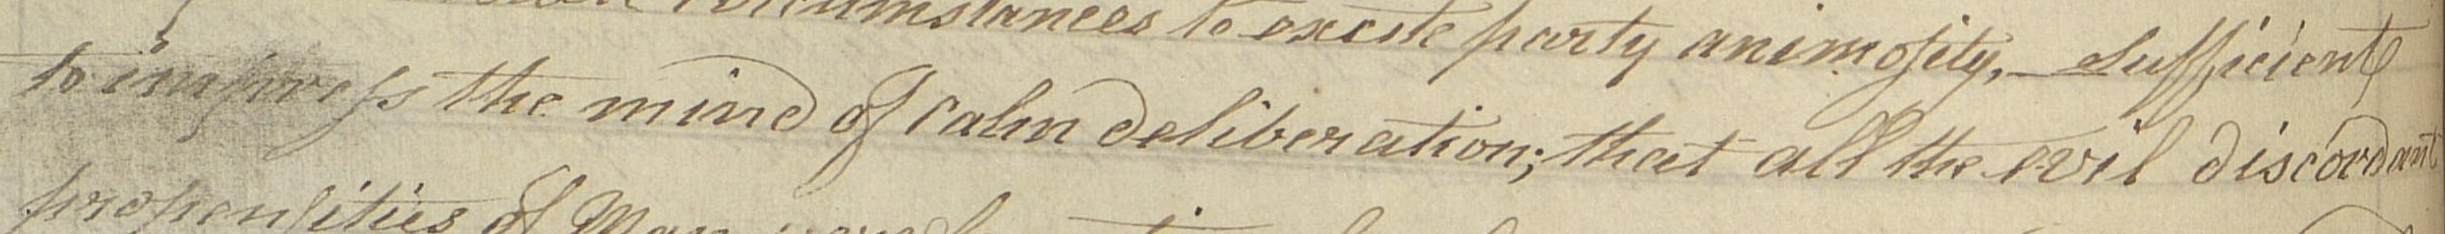to impress the mind of calm deliberation; that all the evil discordant
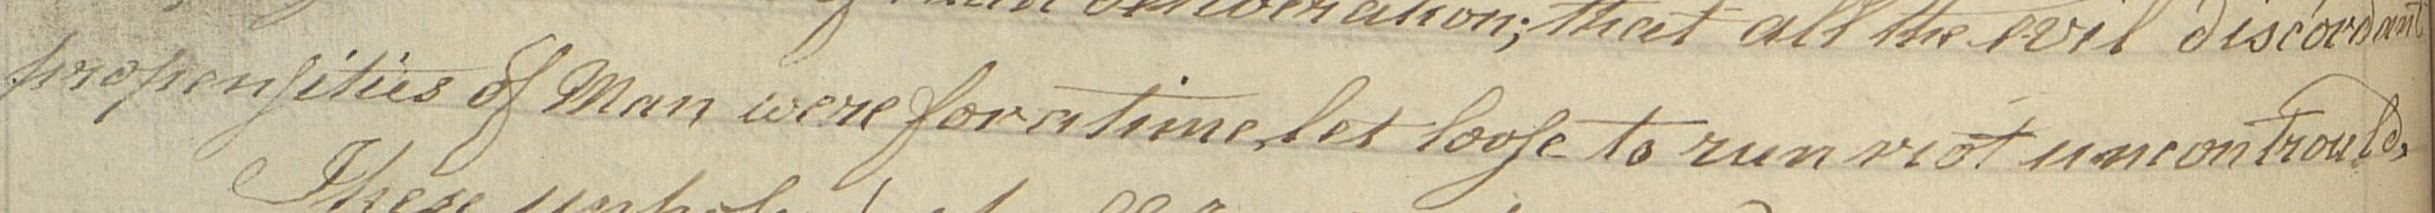propensities of Man were for a time, let loose to run riot uncontrould
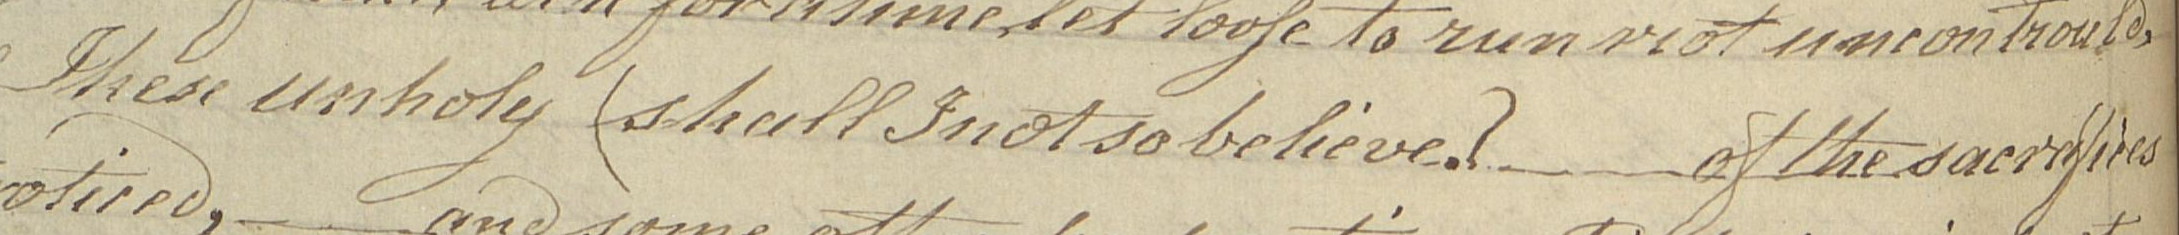These unholy (shall I not so believe? of the sacrafices
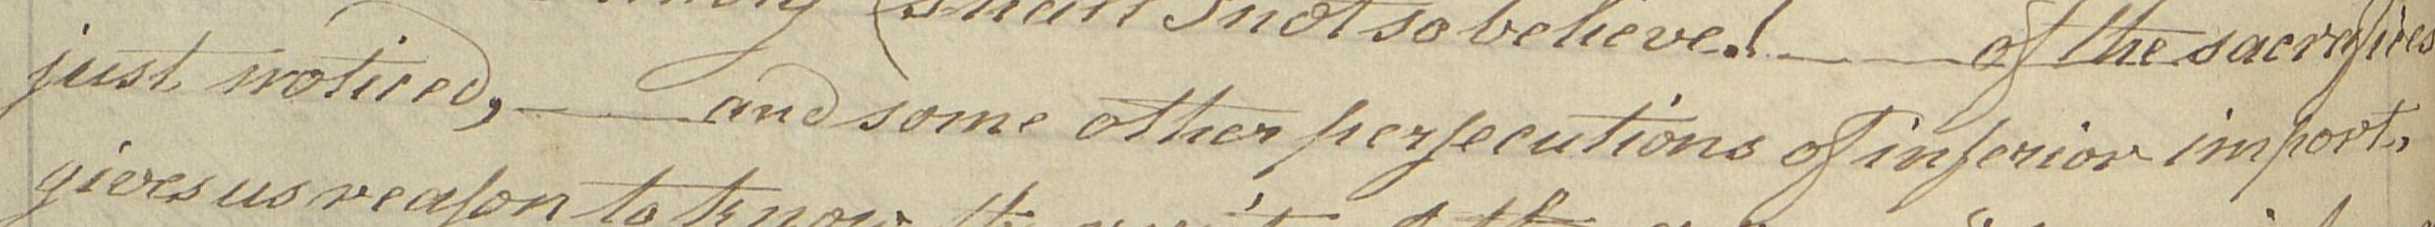just noticed, and some other persecutions of inferior import,
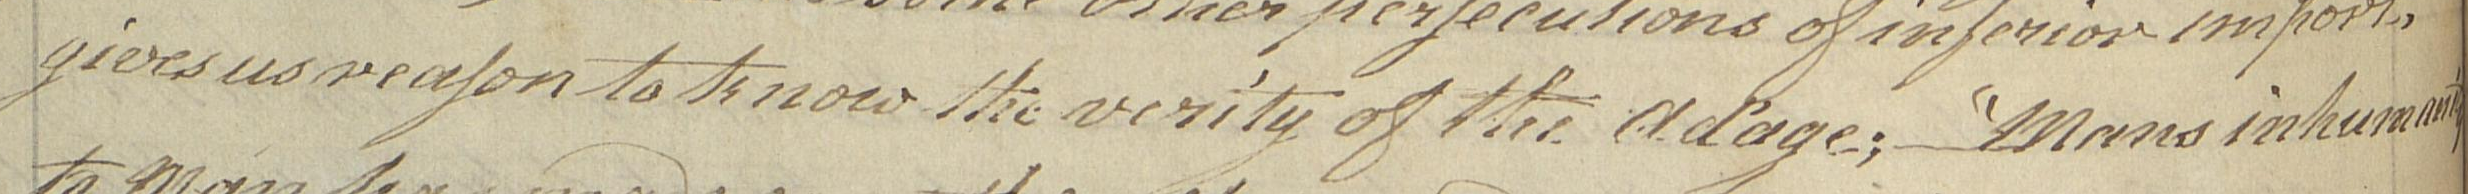gives us reason to know the verity of the Adage; "Mans inhumanity
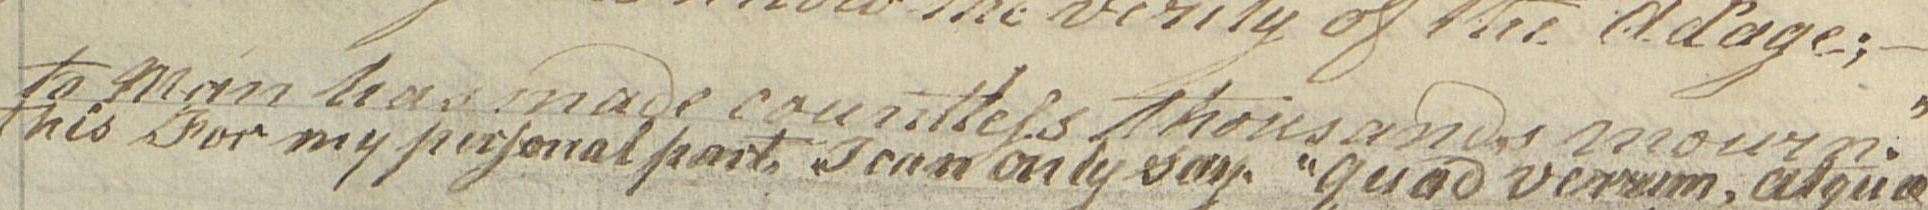to Man has made countless thousands mourn."
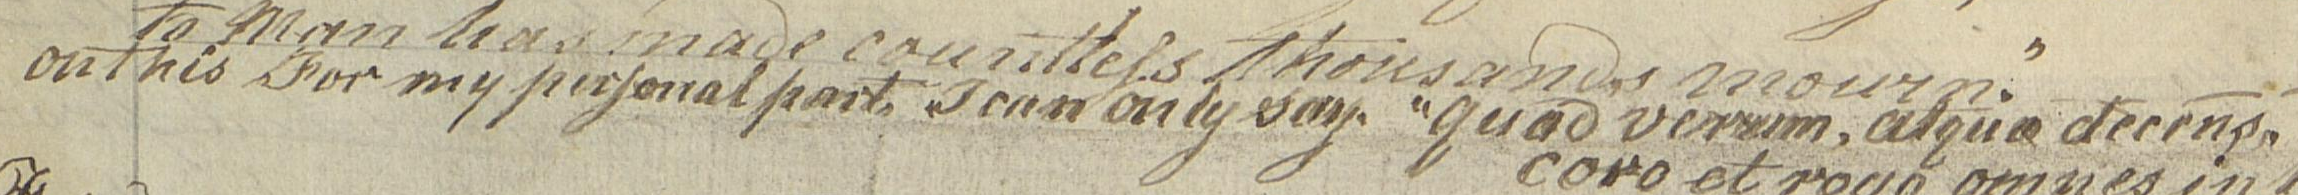on this For my personal part, I can only say, "Quad verum, alqua decens.
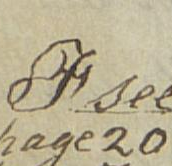F see
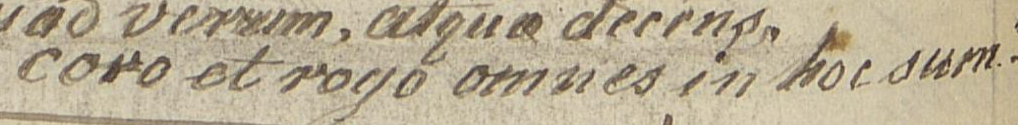coro et rogo omnes in hoc sum."
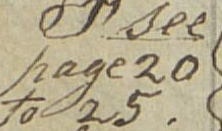page 20
